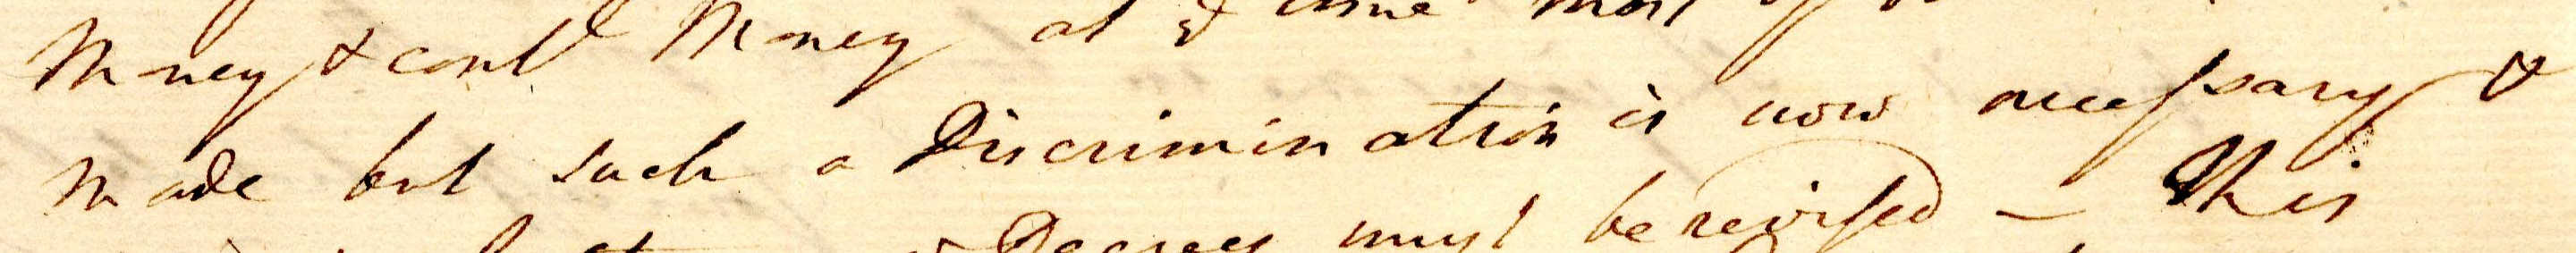made but such a Discrimination is now necessary &
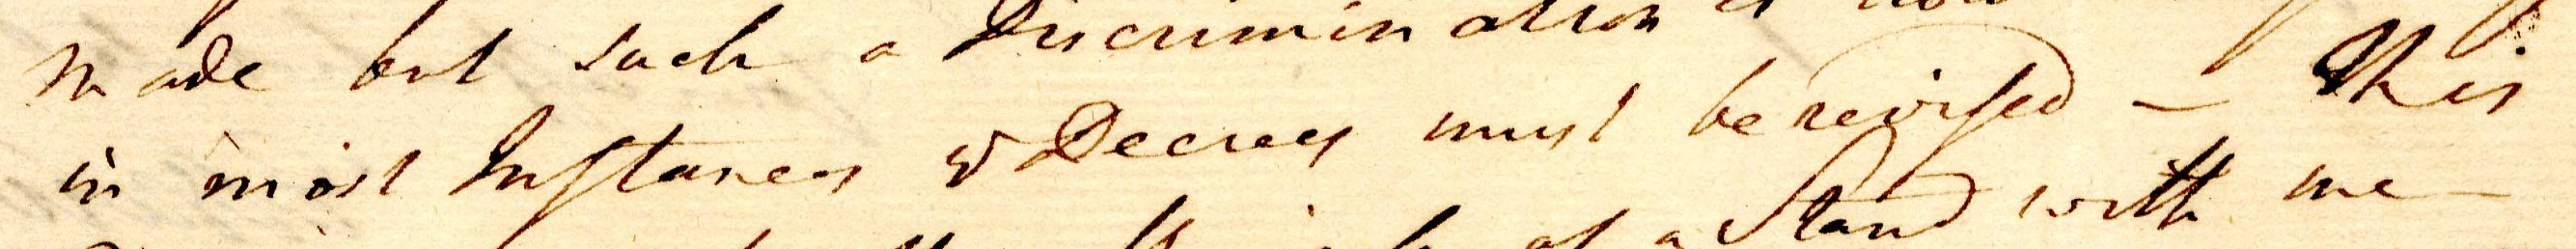in most Instances y^e Decrees must be revised. This
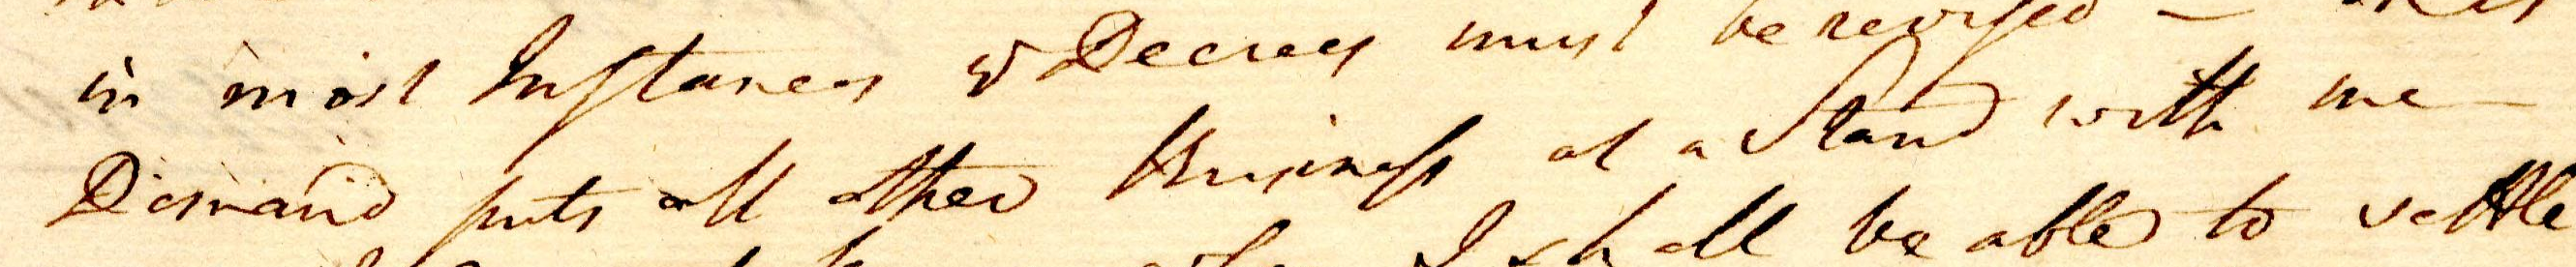Demand puts all other Business at Stand with me
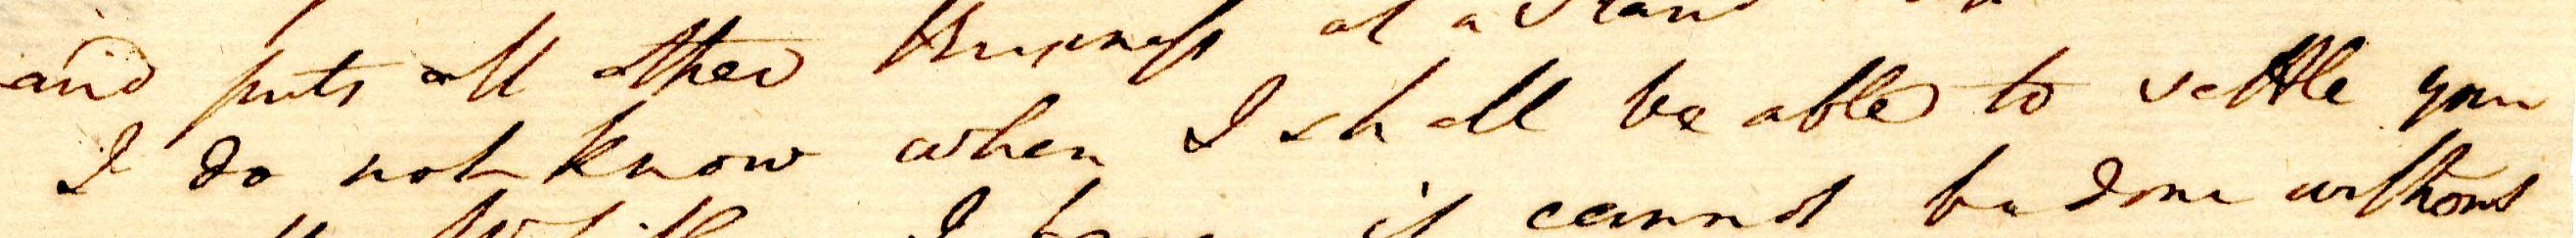I do not know when I shall be able to settle your
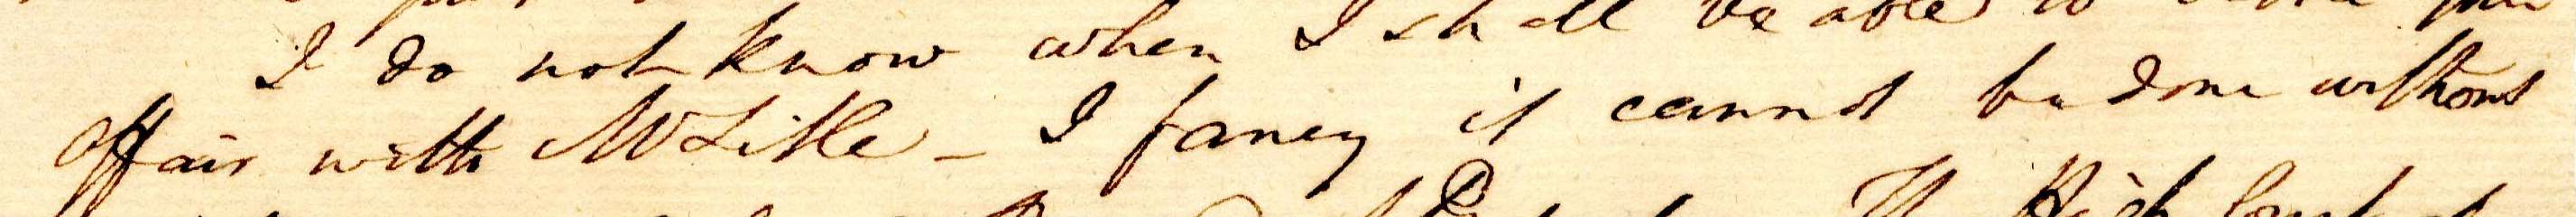Affair with M^r Litle. I faney it cannot be done without
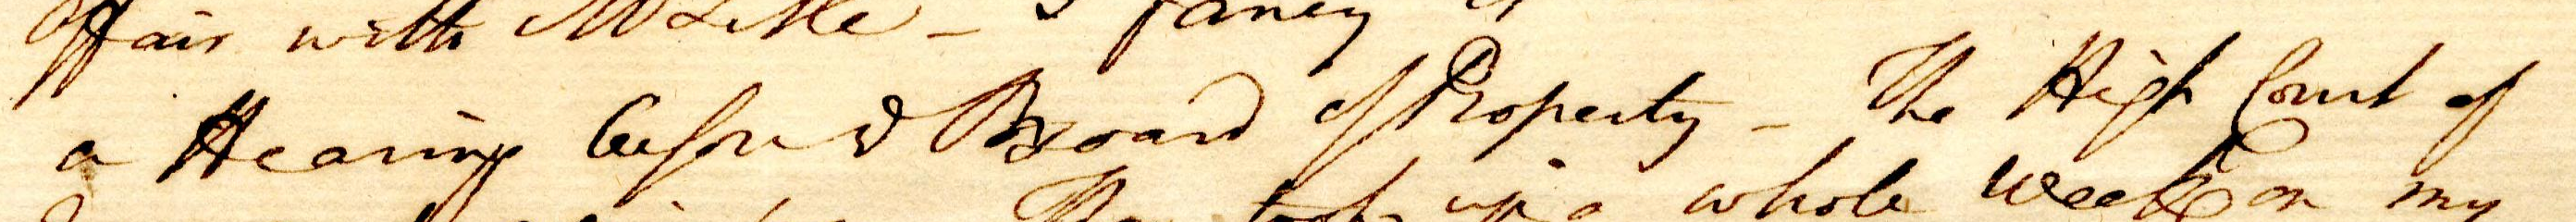a Hearing before y^e Board of Property- The High Court of
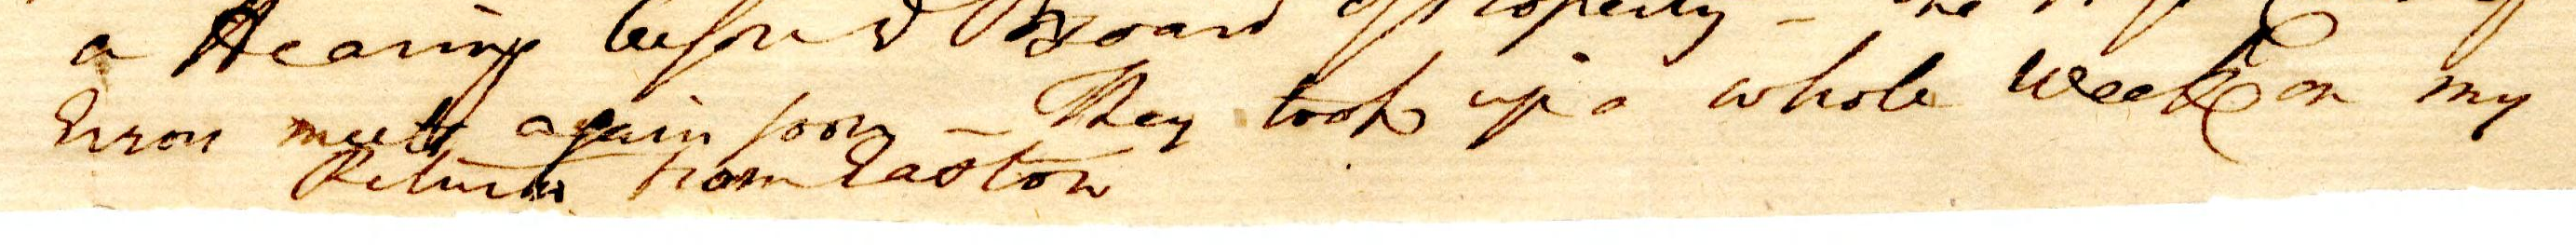Error meets again soon. They took up a whole week on my
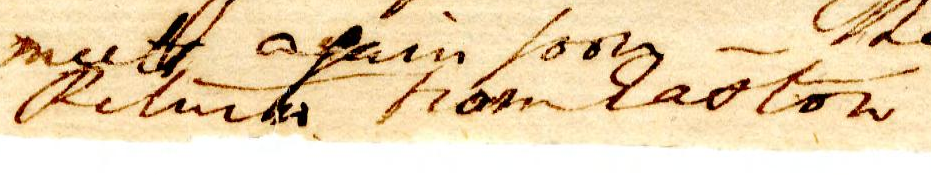Return from Easton
